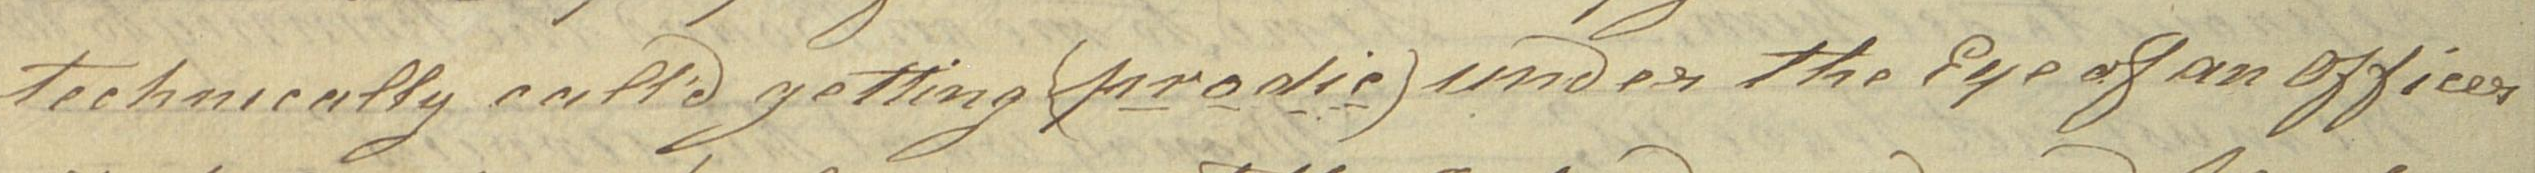technically call'd getting (prodic) under the Eye of an Officer
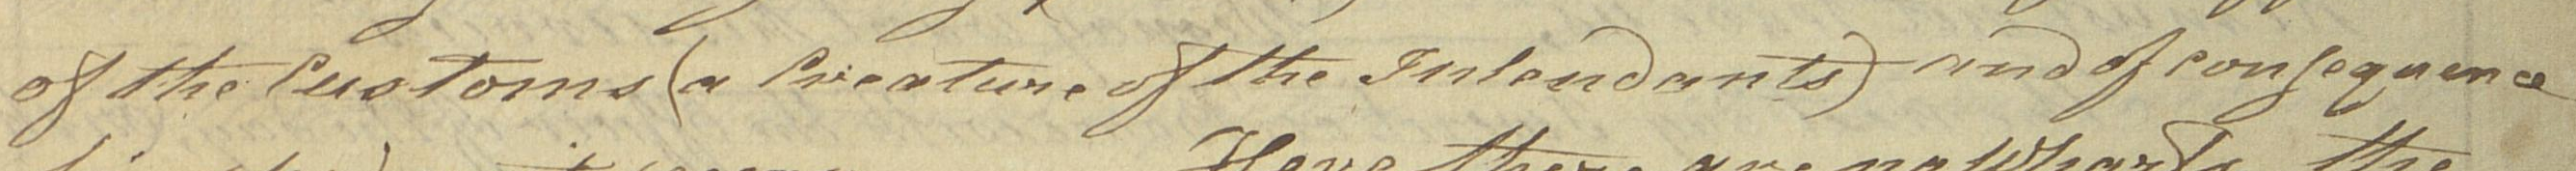of the Customs (a Creature of the Intendants) and of consequence
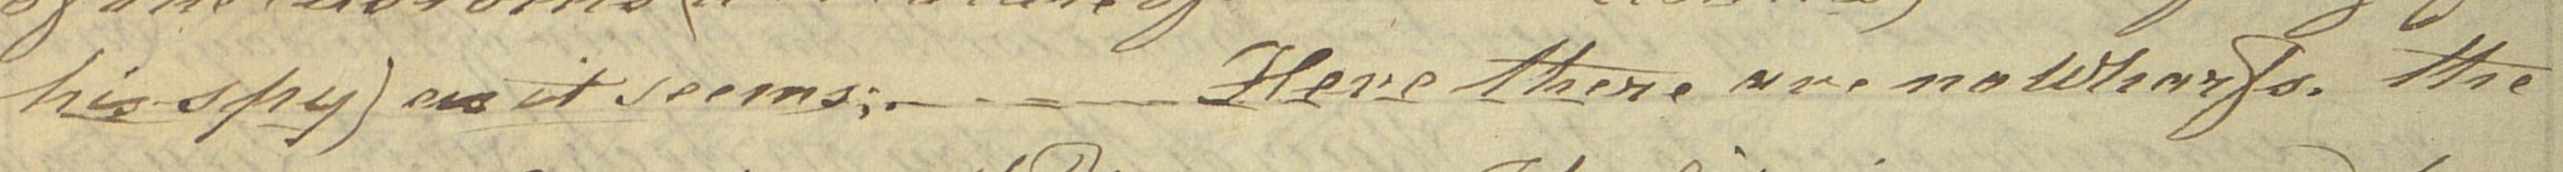his spy) as it seems; Here there are no Wharfs. the
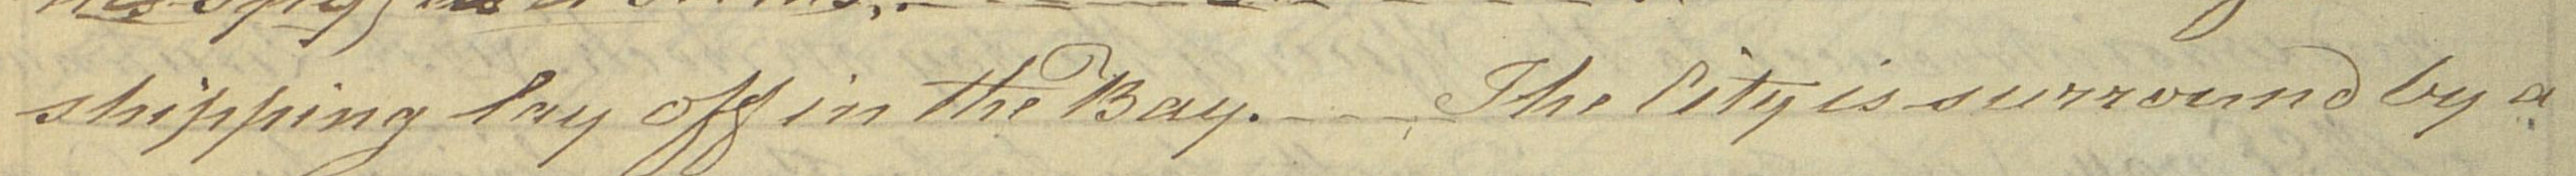shipping lay off in the Bay. The City is surround by a
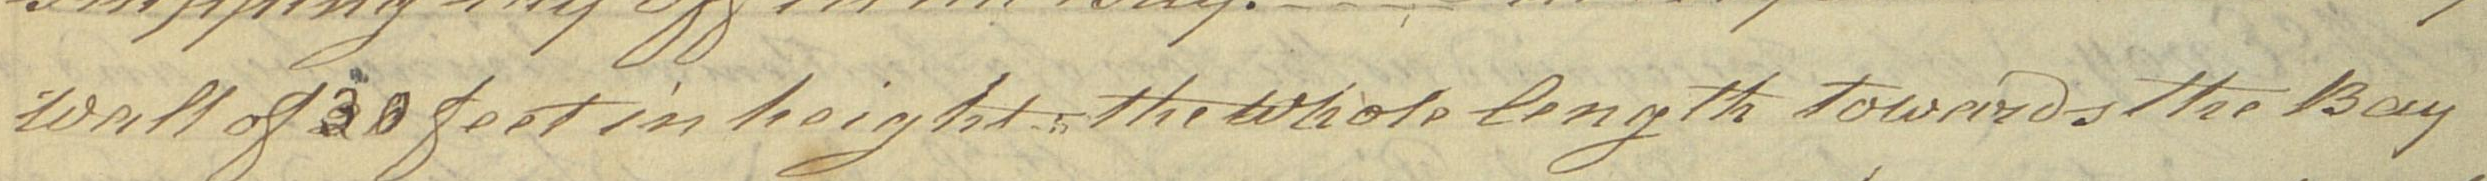wall of 30 feet in height the Whole length towards the Bay
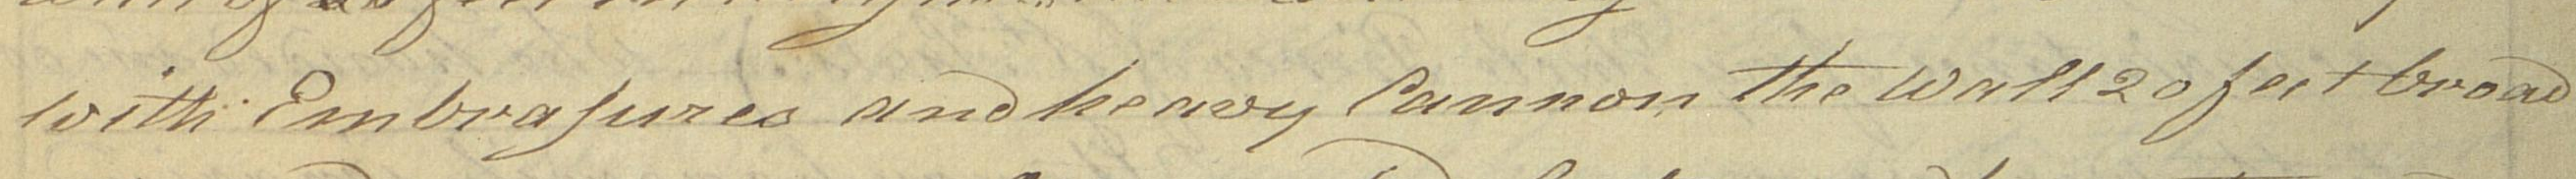with Embrasures and heavy Cannon the Wall 20 feet broad
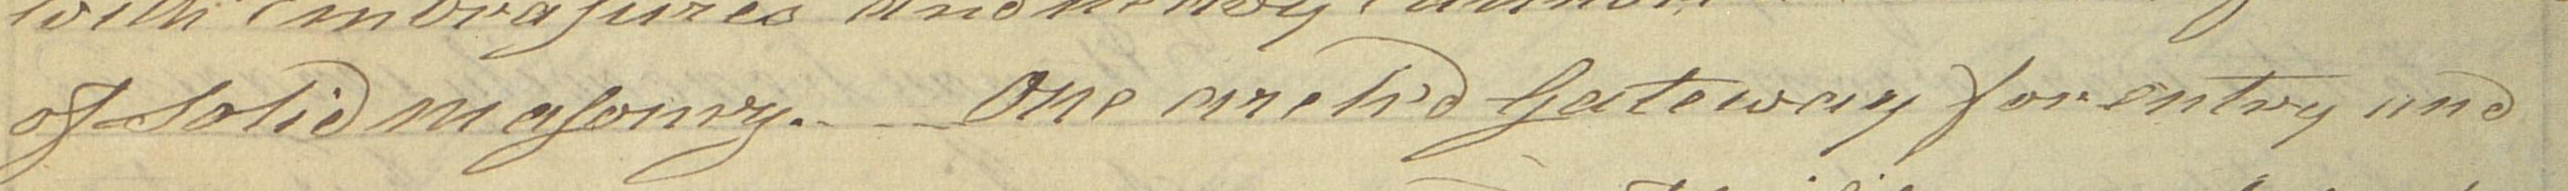of solid masonry. One arch'd Gateway for entry and
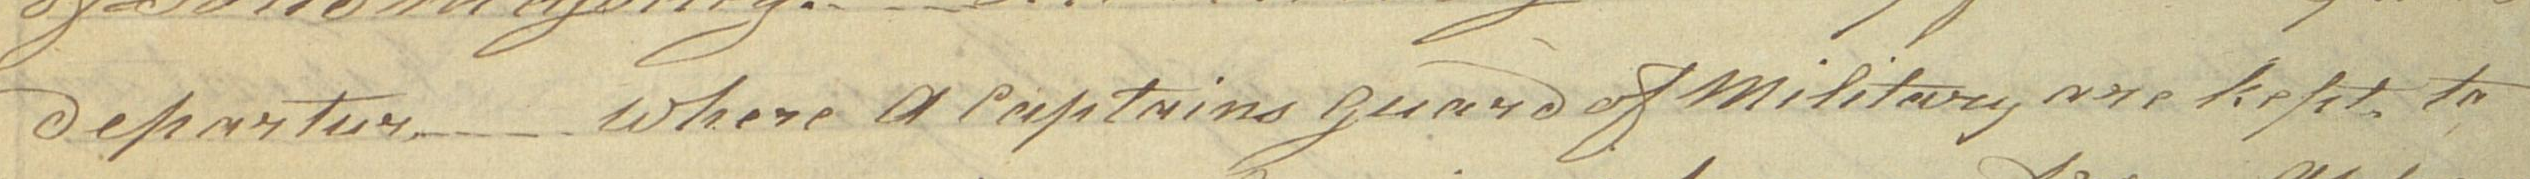departur where a captains guard of Military are kept to
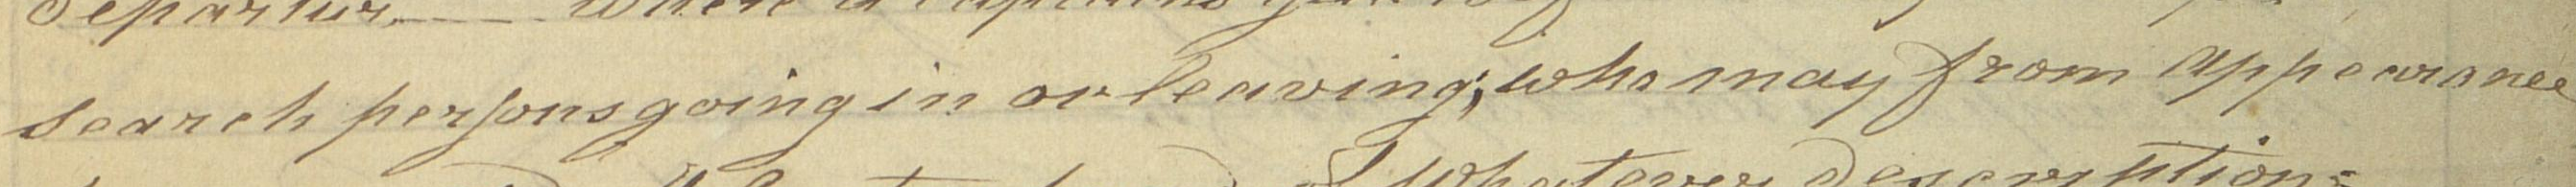search persons going in or leaving; who may from Appearance
